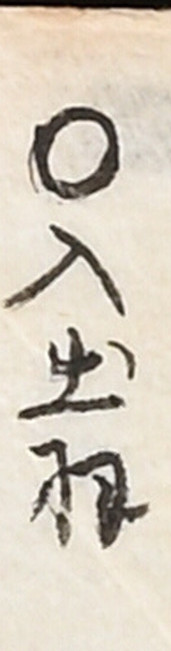〇入出羽
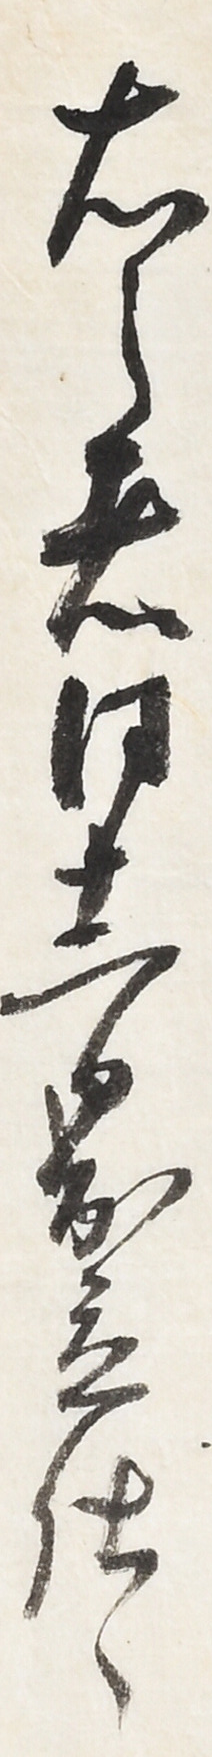右之者同十二日出立仕候
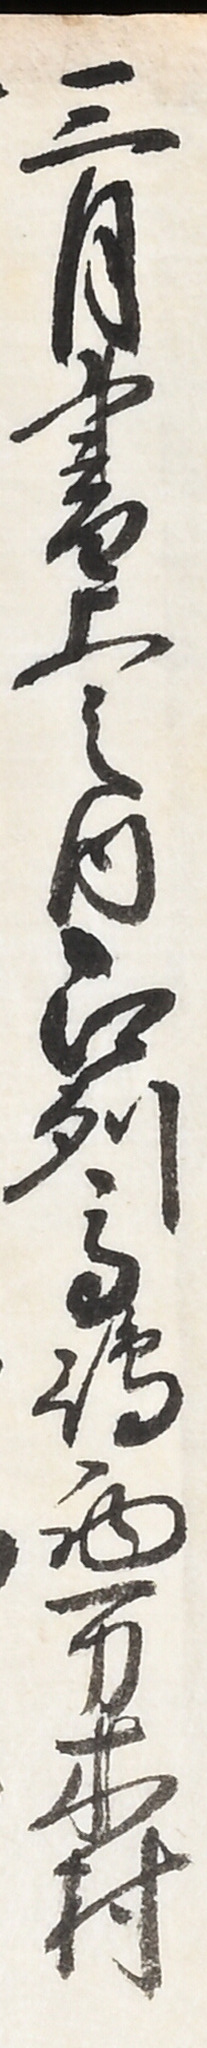三月書上之内江州高嶋西万木村
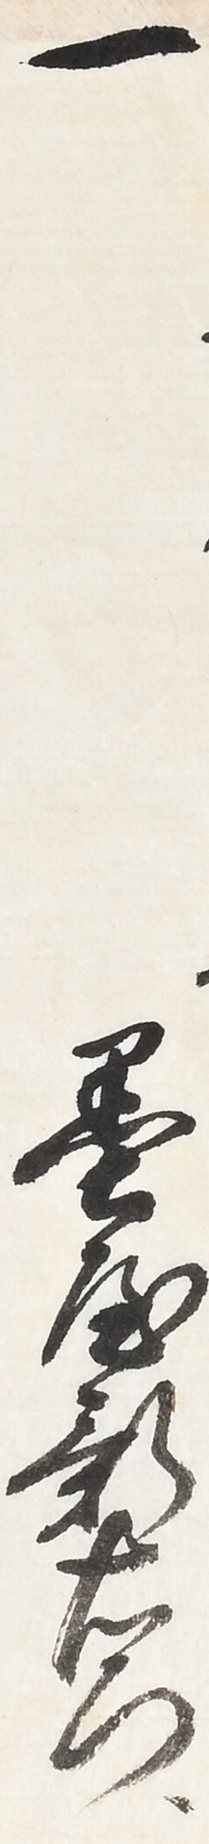一墨屋新右衛門、
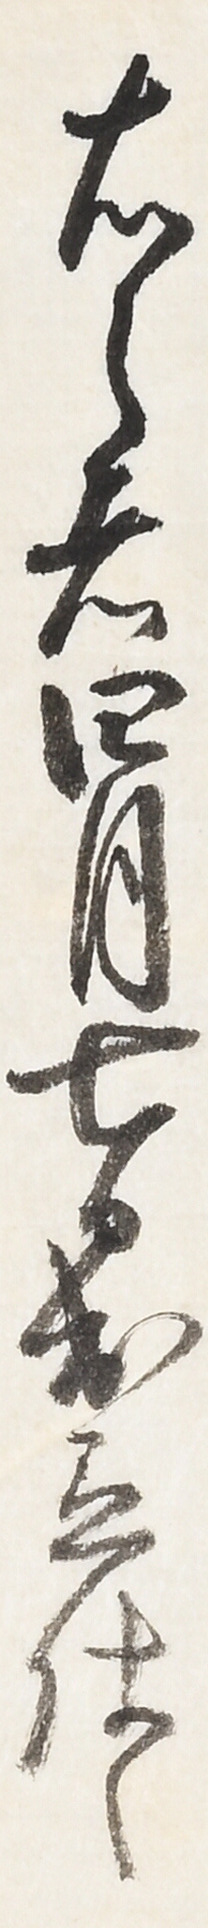右之者四月七日出立仕候
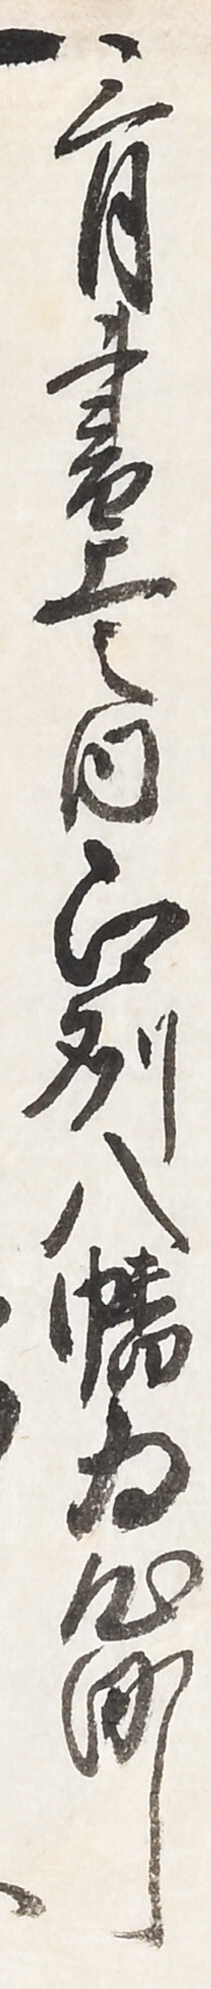三月書上之内江州八幡ゐ心町
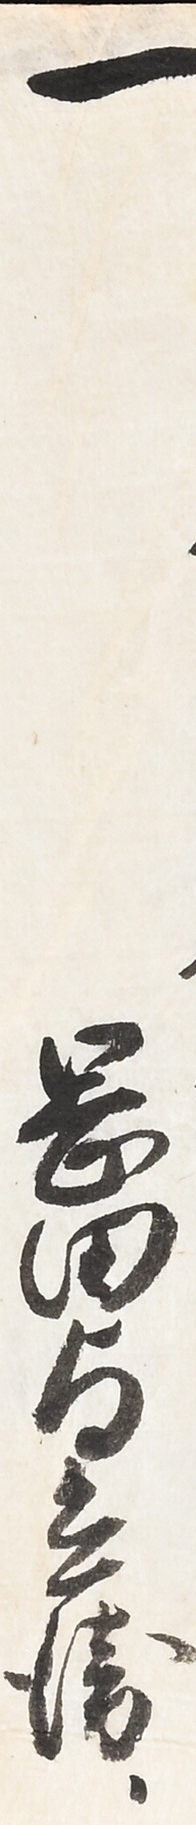一岡田与兵衛
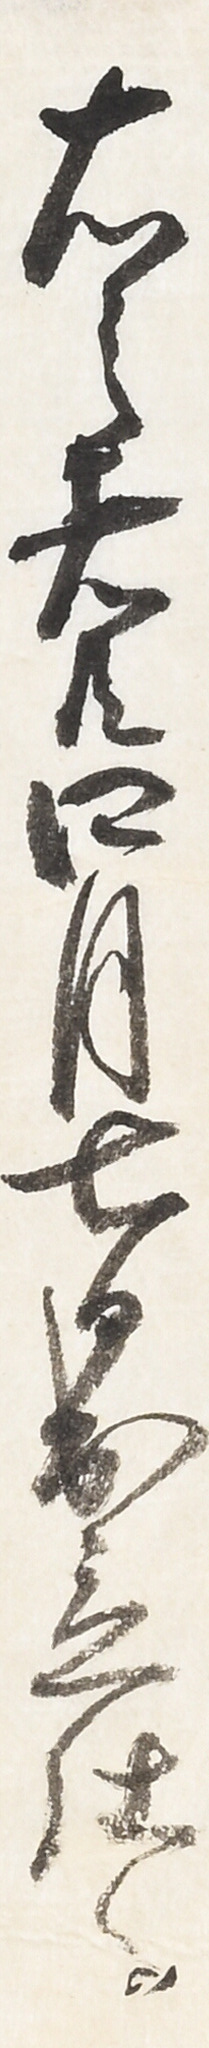右之者共四月七日出立仕候
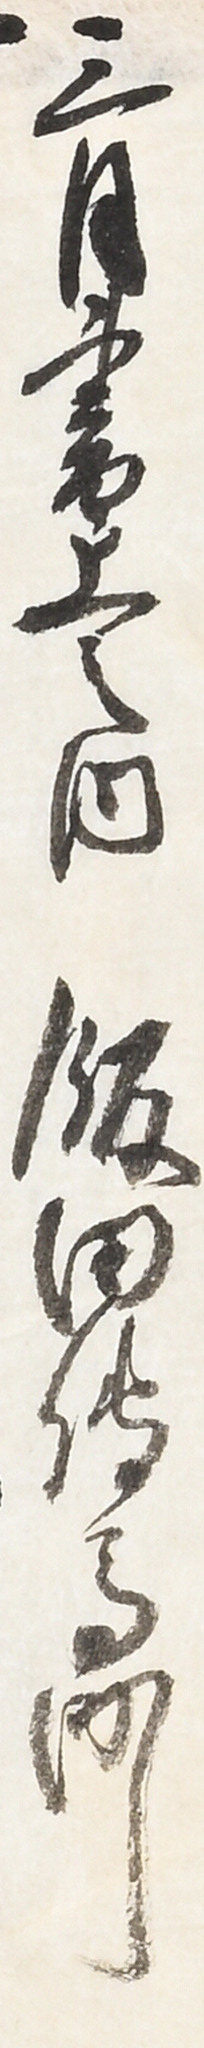三月書上之内飯田伝馬町
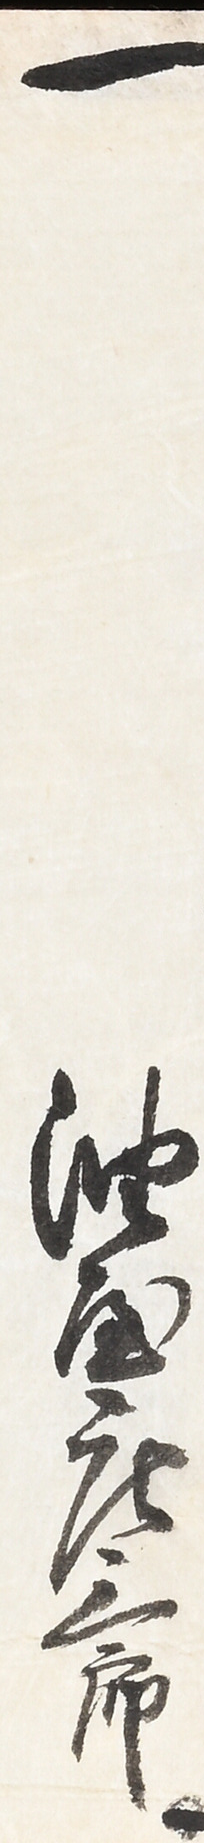一油屋庄三郎、
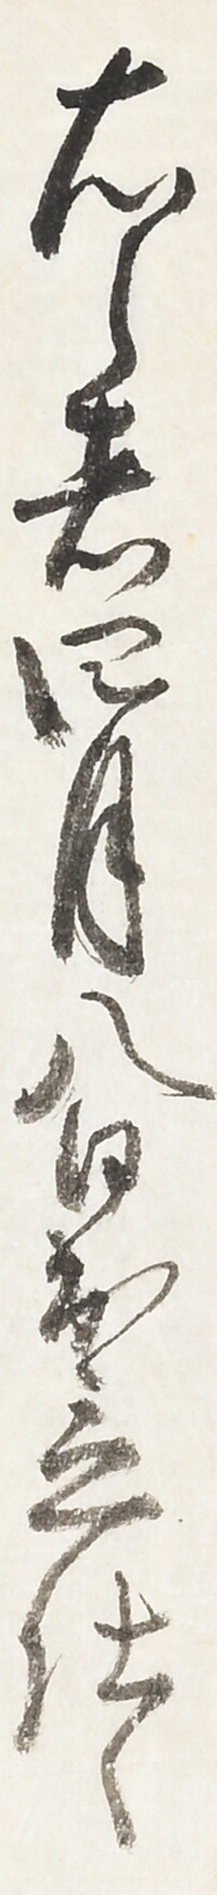右之者四月八日出立仕候
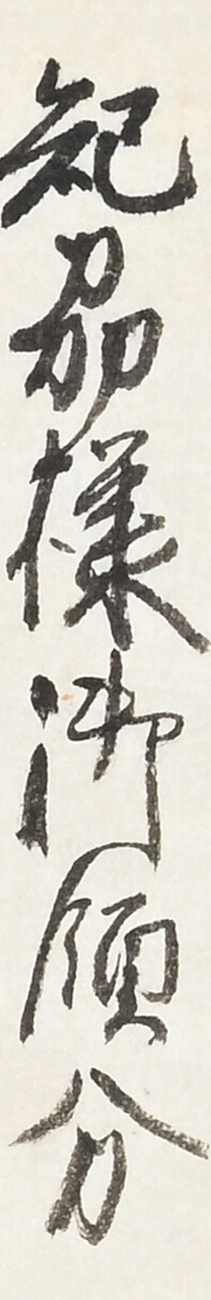紀州様御領分
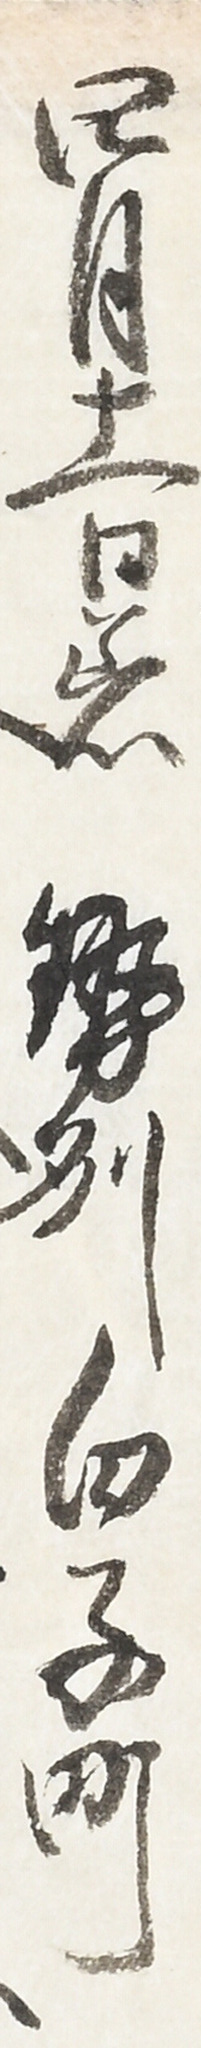四月十一日着勢州白子町
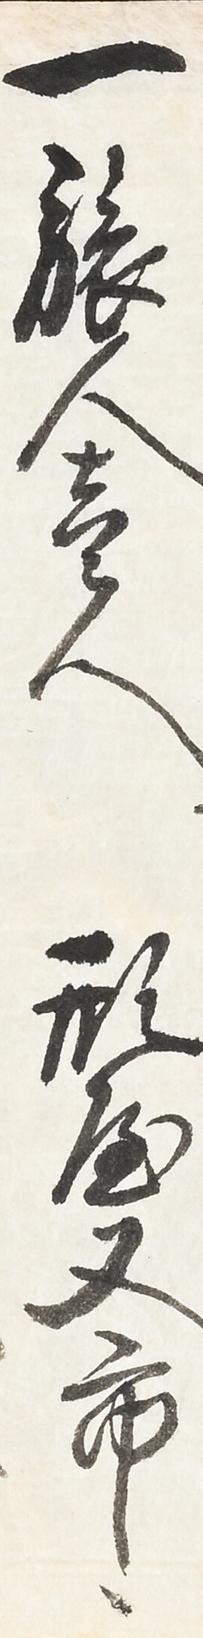一旅人壱人形屋又市、
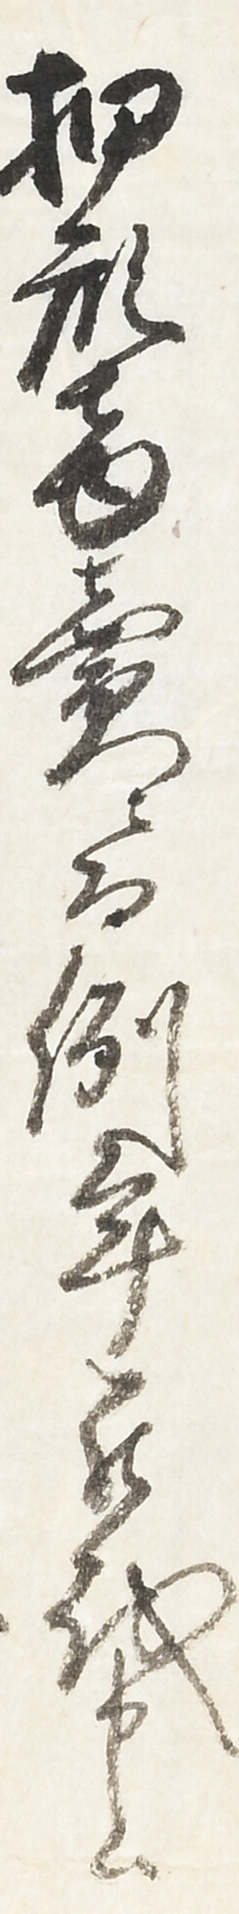押形商売ニ而例年罷越申候
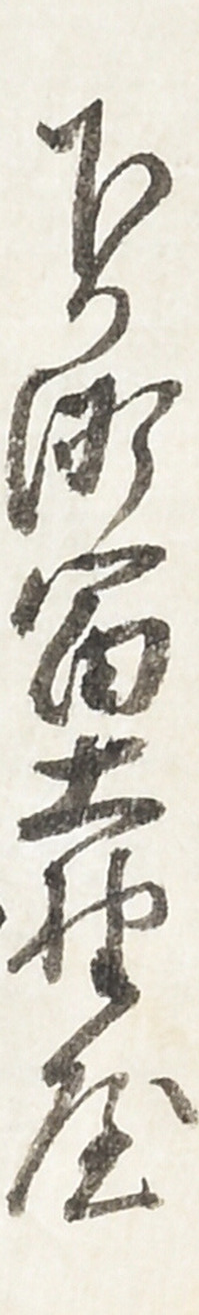下り町冨士野屋
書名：旅人泊控帳
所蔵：伊那市立高遠町図書館・合同会社AMANE
